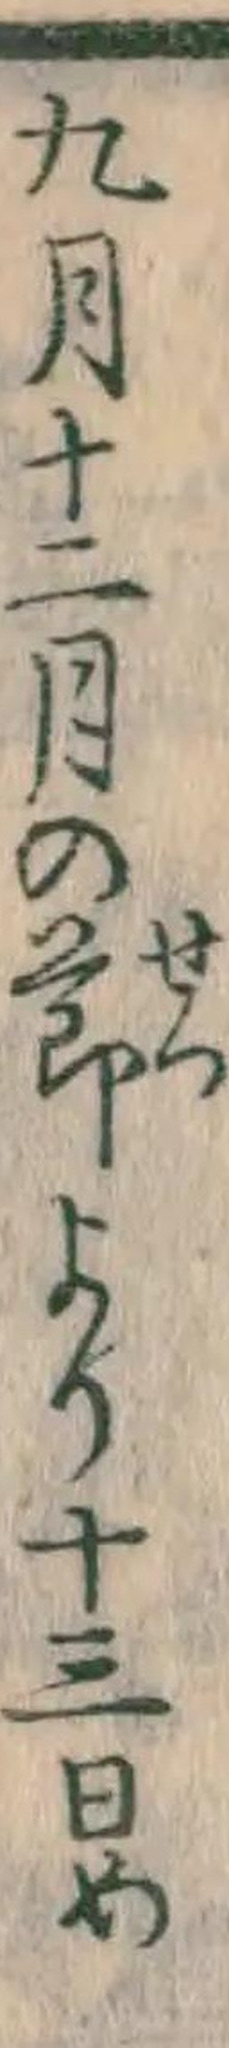九月十二月の節より十三日め
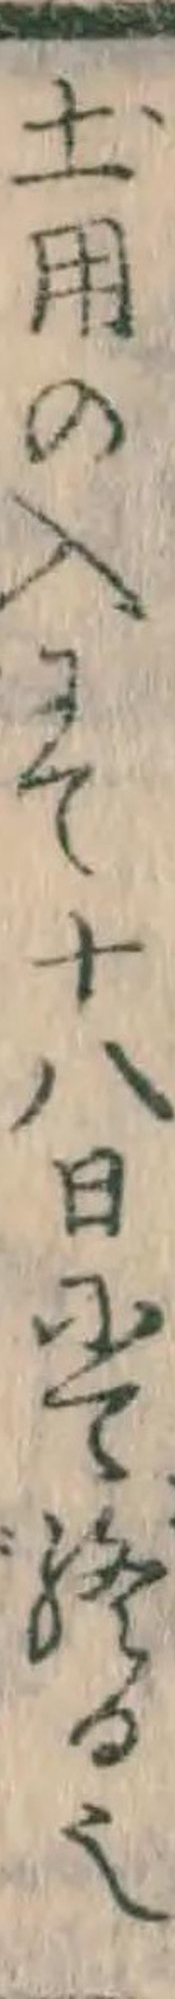土用の入にて十八日にて終る也
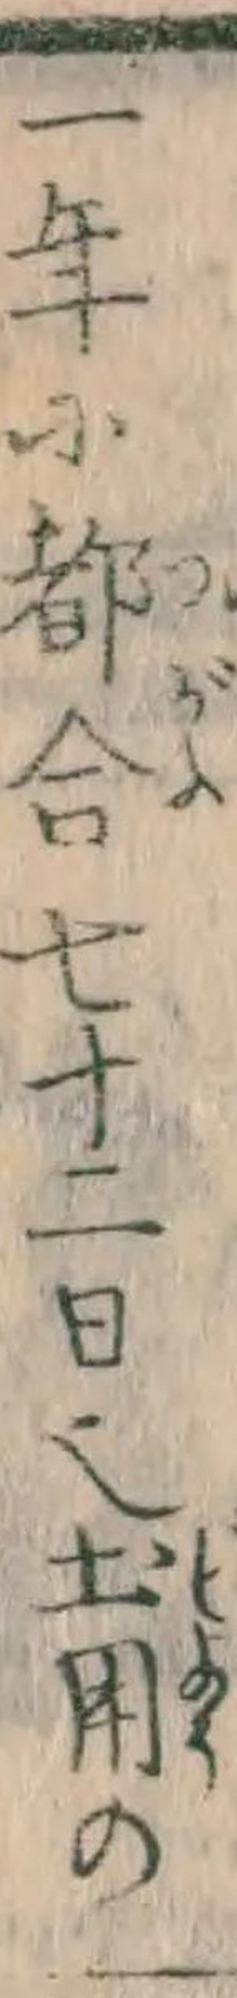一年に都合七十二日也土用の
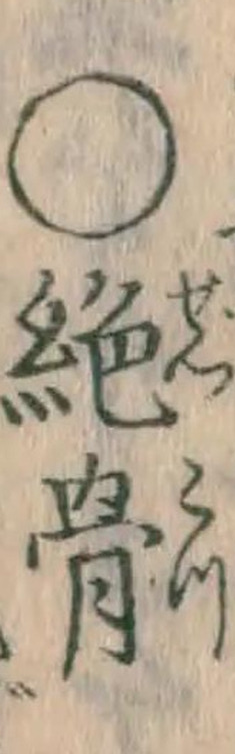○絶骨
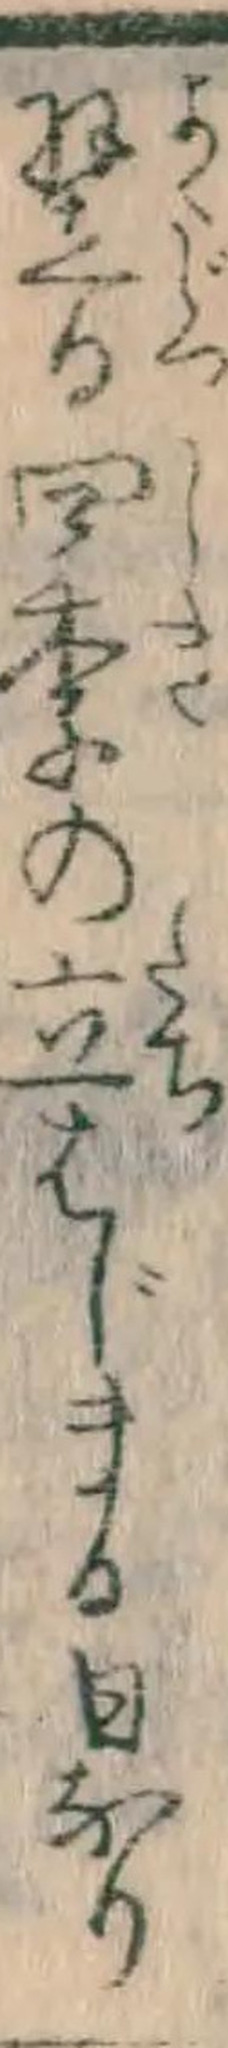翌日四季の立はじまる日なり
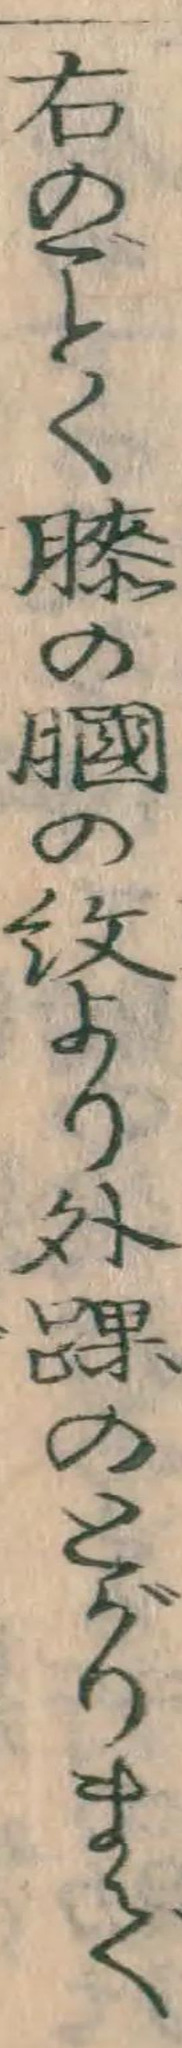右のごとく膝の膕の紋より外踝のとがりまで
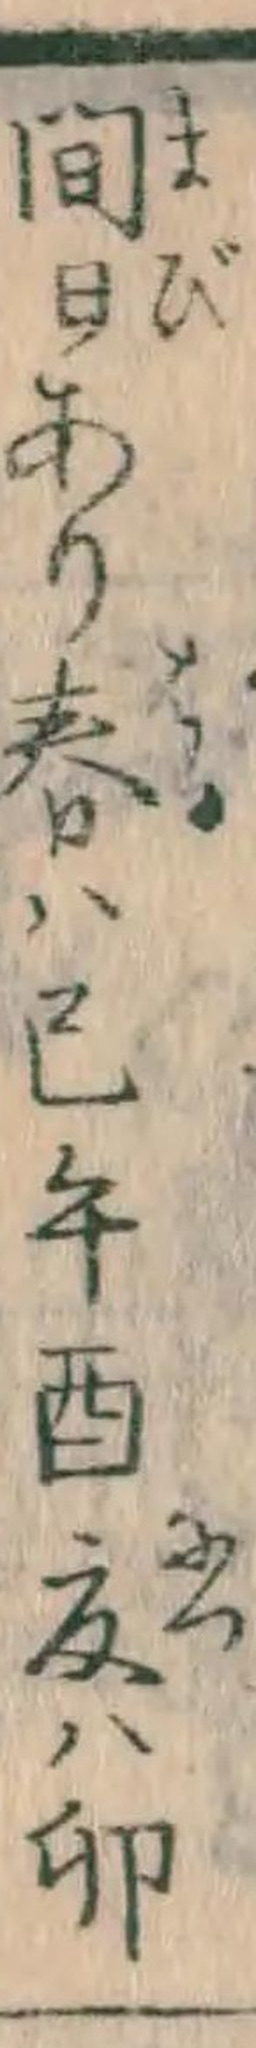間日あり春は巳午酉夏は卯
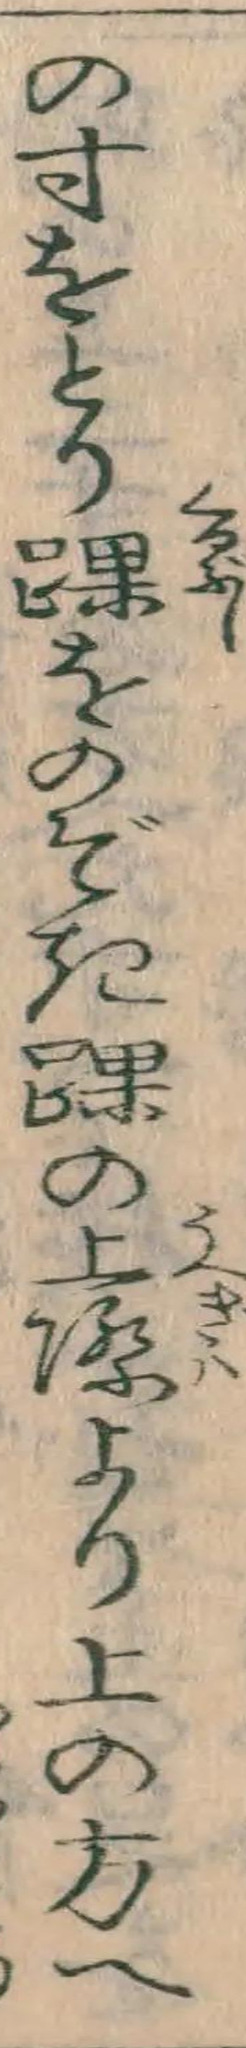の寸をとり踝をのぞき踝の上際より上の方へ
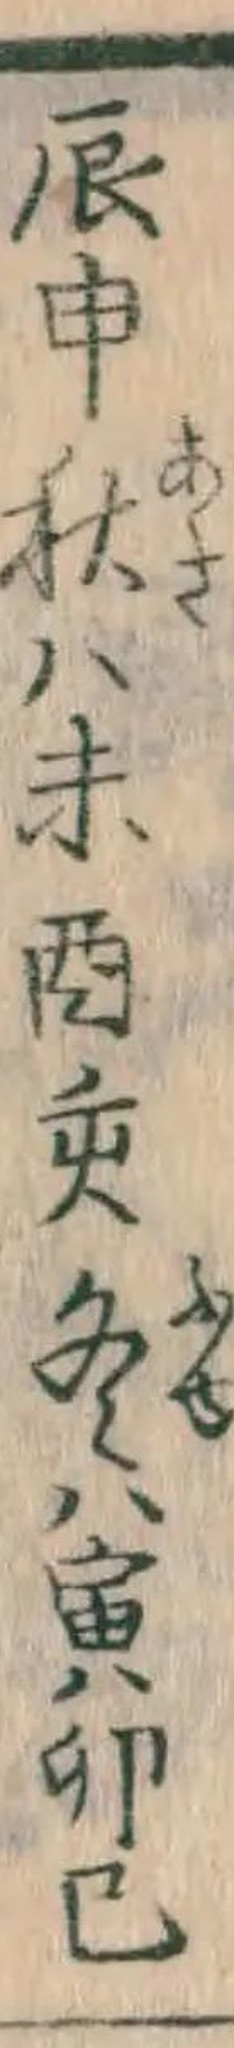辰申秋は未酉亥冬は寅卯巳
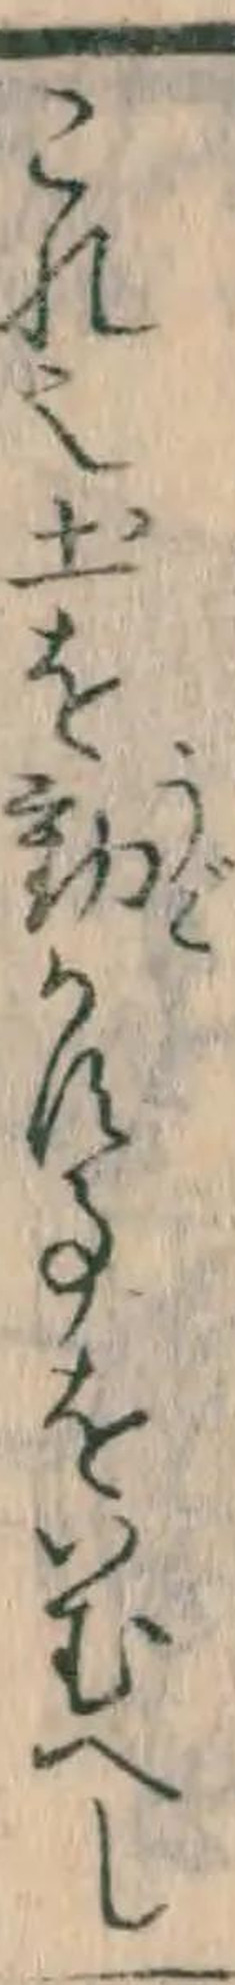これ也土を動かす事をいむへし
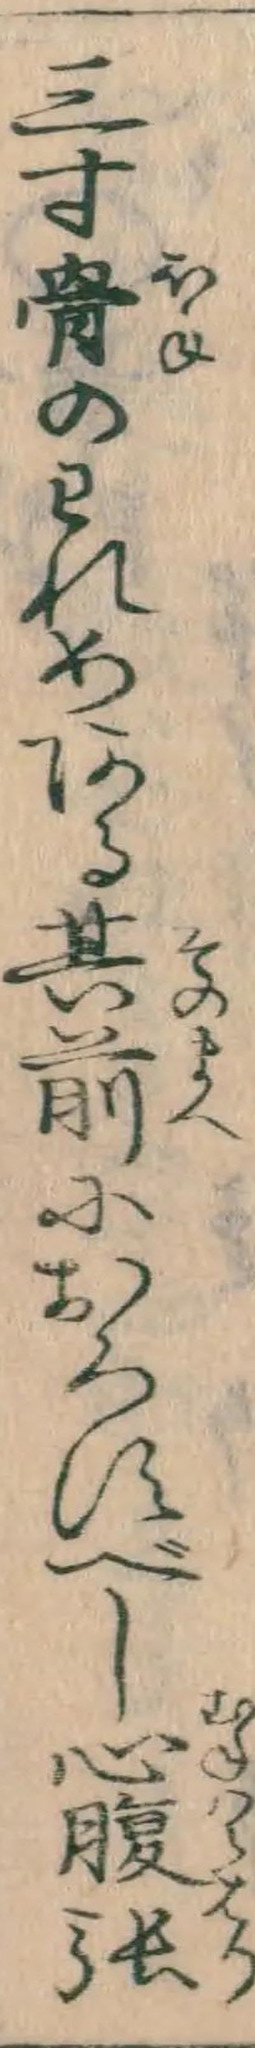三寸骨のわれめある其前におろすべし心腹張
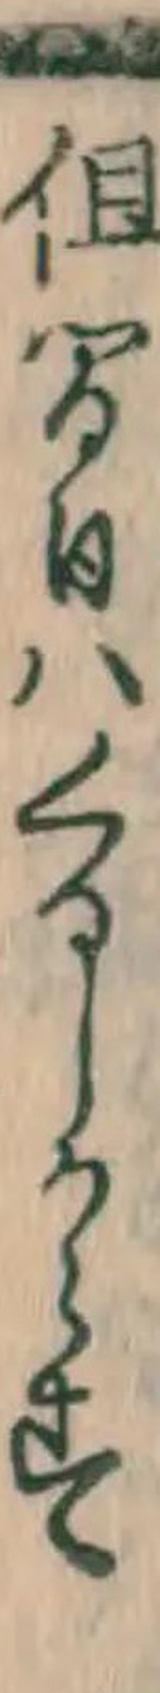但間日はくるしからす
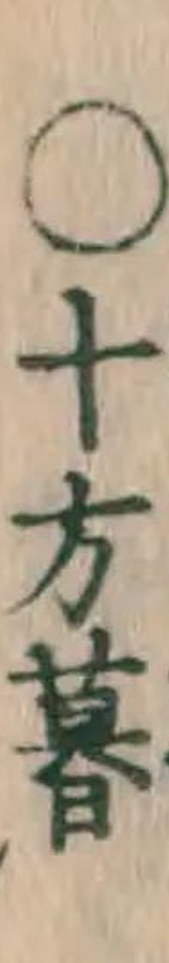○十方暮
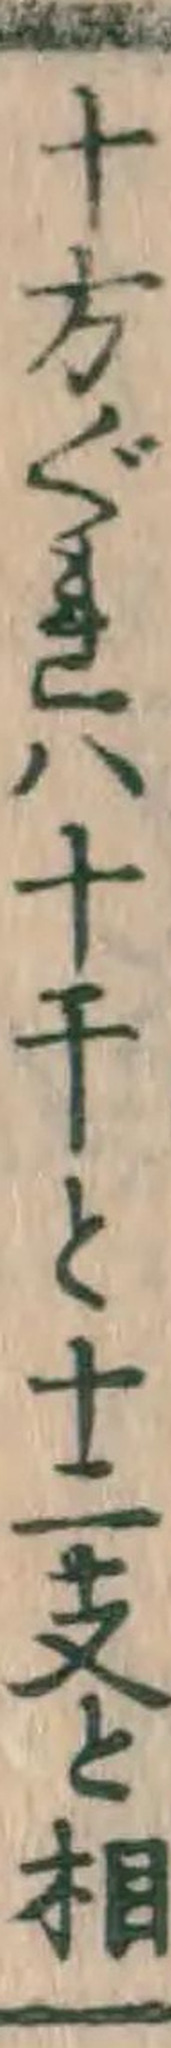十方ぐれは十干と十二支と相
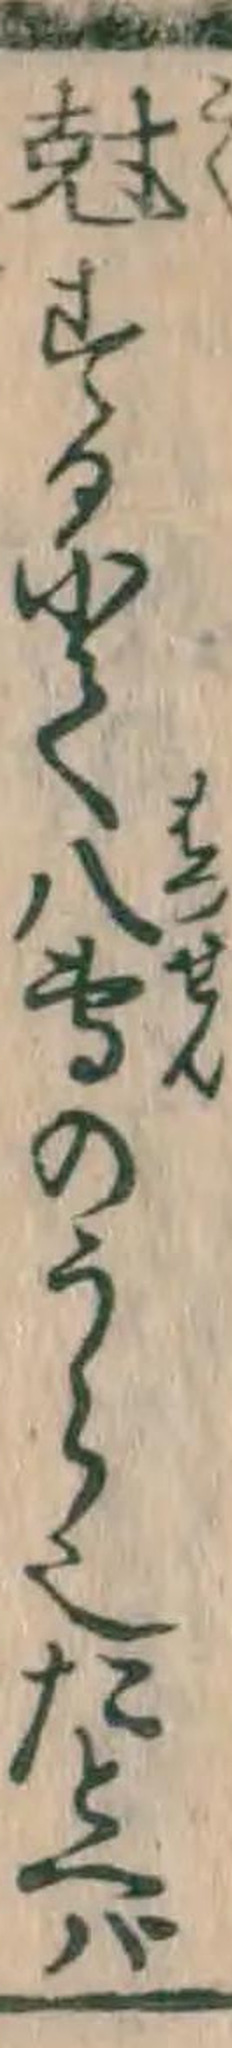剋するにて八専のうら也たとへば
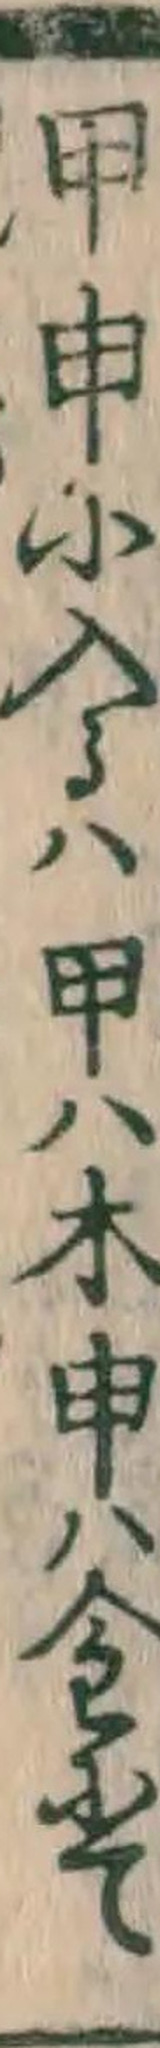甲申に入るは甲は木申は金にて
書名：広益秘事大全 3巻. [4]
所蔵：国立国会図書館 National Diet Library, JAPAN
